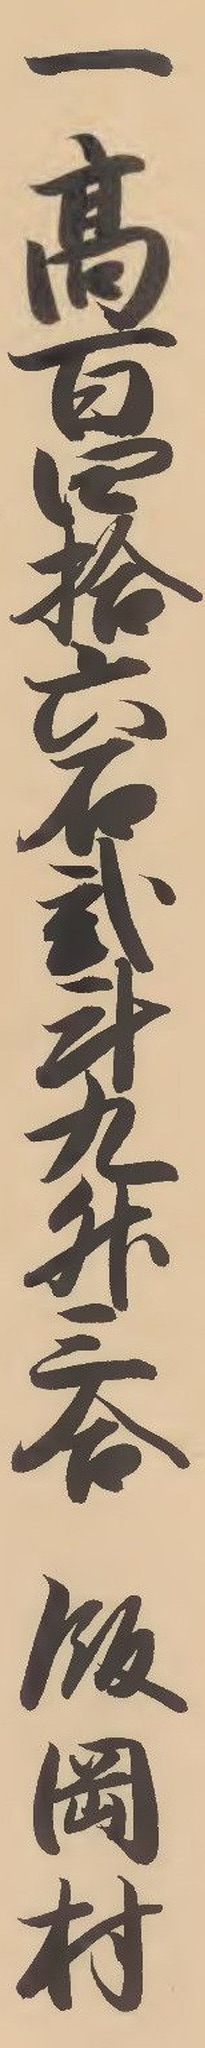一高百四拾六石弐斗九升三合飯岡村
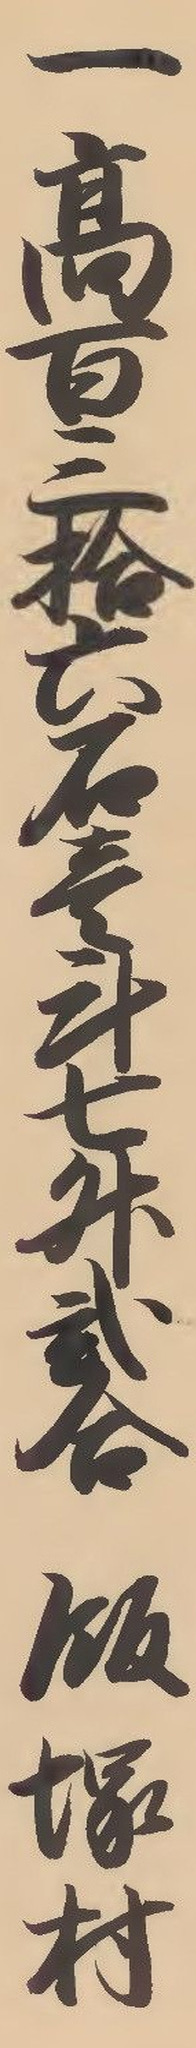一高百三拾六石壱斗七升弐合飯塚村
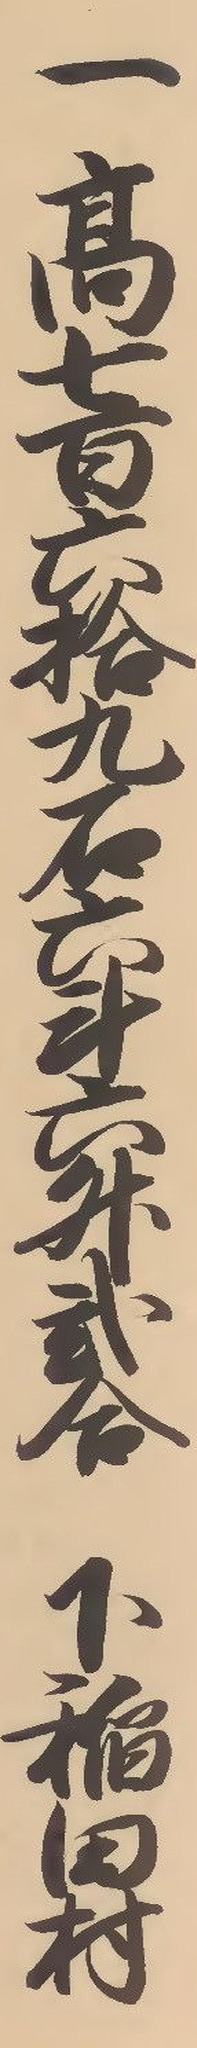一高七百六拾九石六斗六升弐合下稲田村
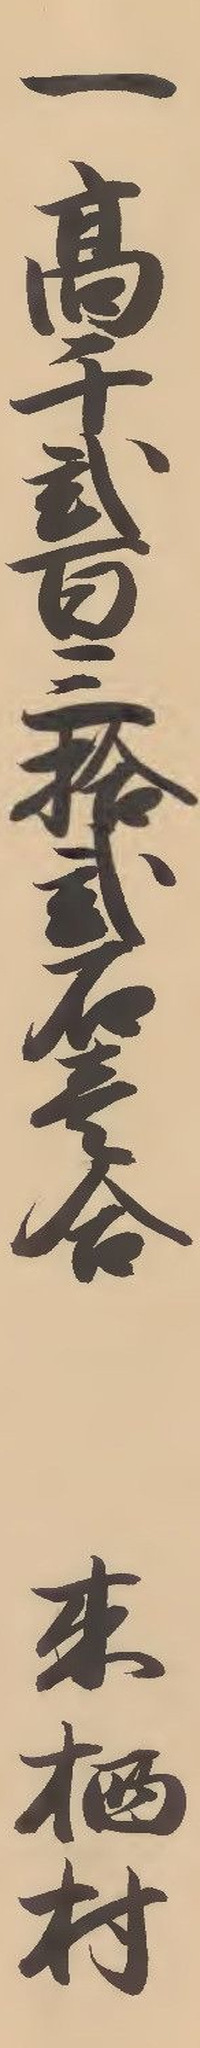一高千弐百三拾弐石壱合来栖村
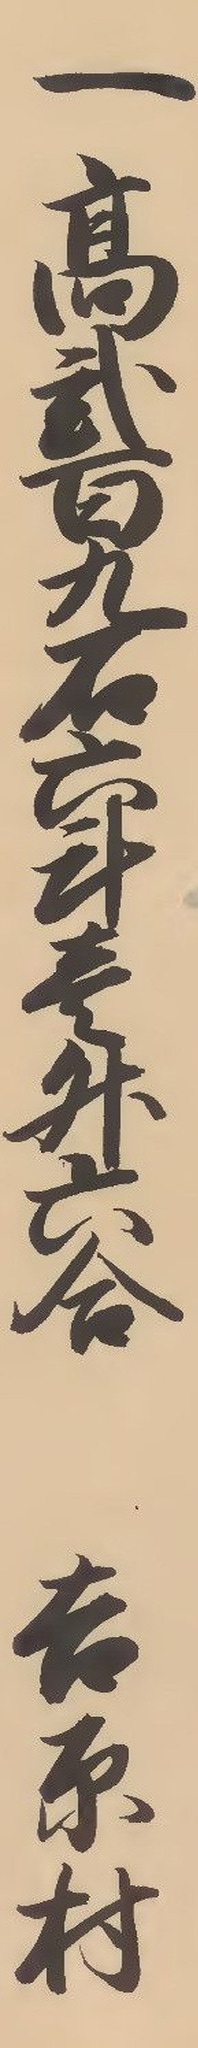一高弐百九石六斗壱升六合吉原村
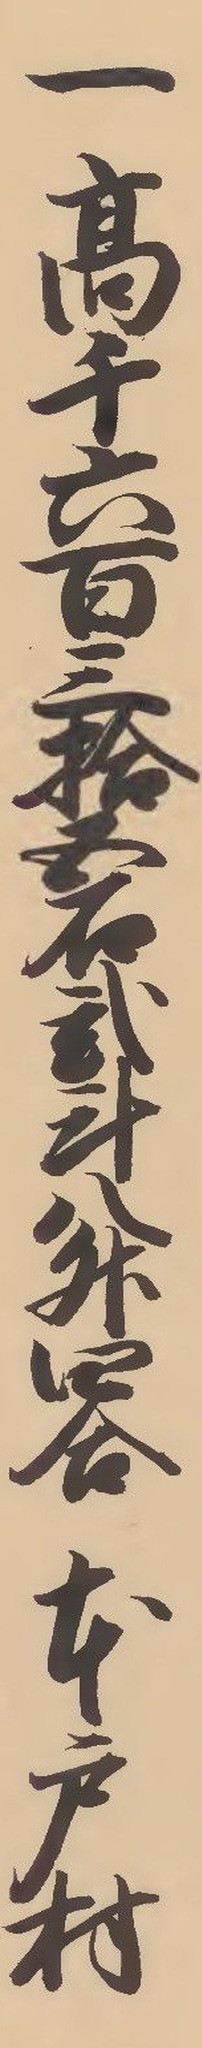一高千六百三拾五名弐斗八升四合本戸村

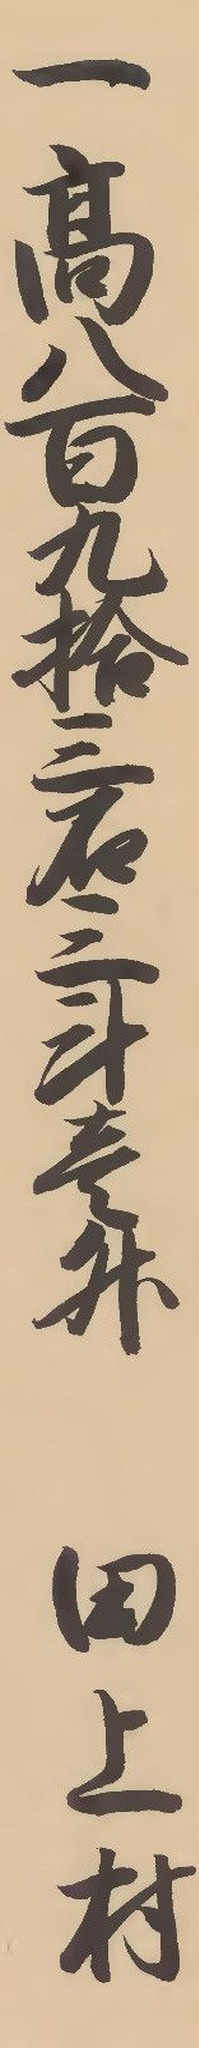一高八百九拾三石三斗壱升田上村
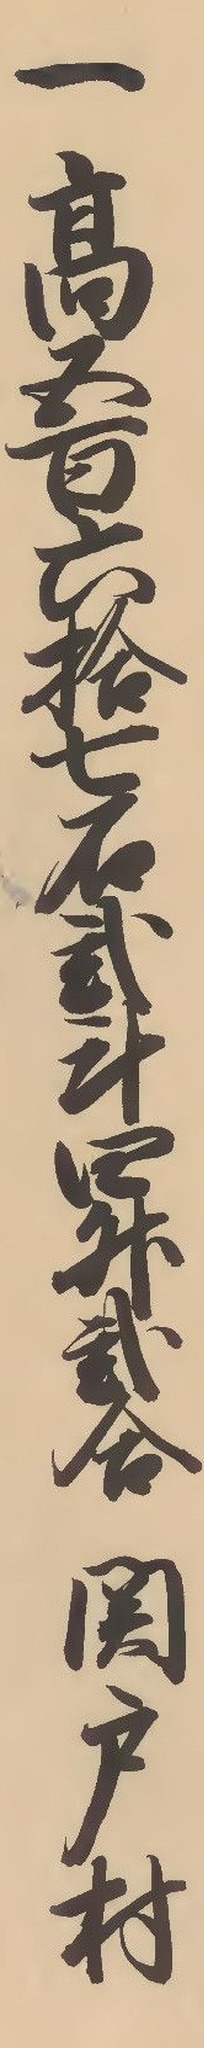一高五百六拾七石弐斗四升弐合関戸村
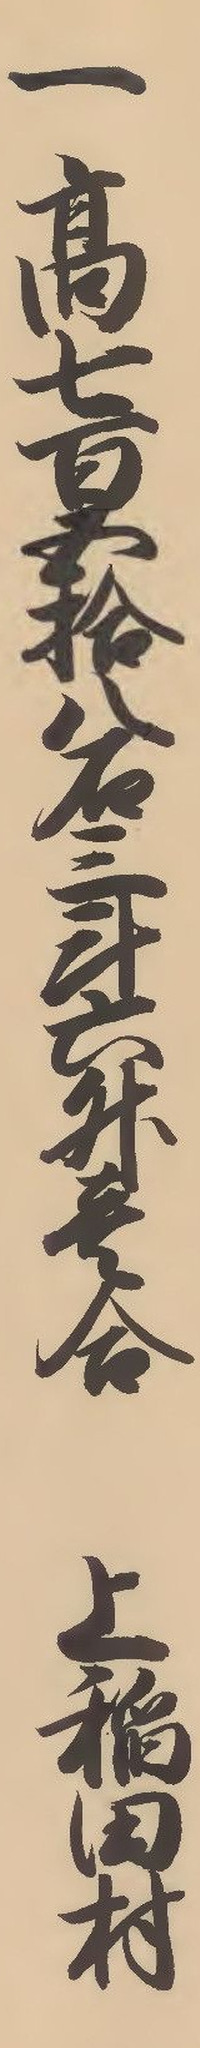一高七百五拾八石三斗六升壱合上稲田村
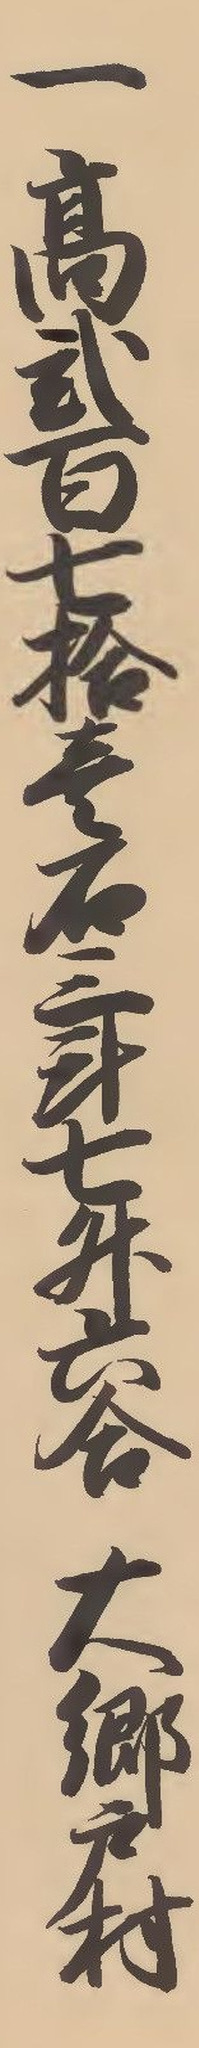一高弐百七拾壱石三斗七升六合大郷戸村
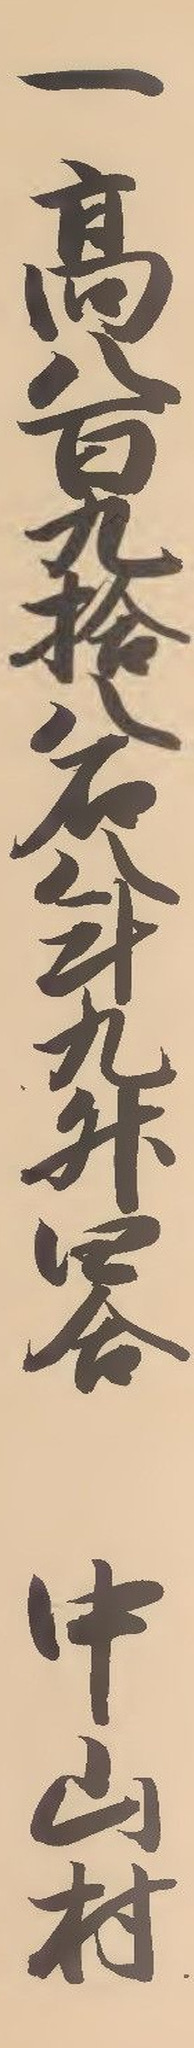一高八百九拾八石八斗九升四合中山村
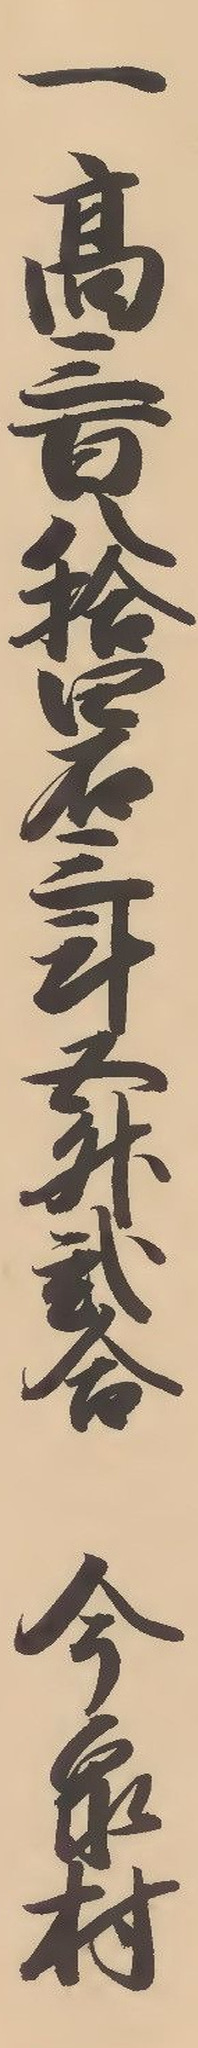一高三百八拾四石三斗五升弐合今泉村
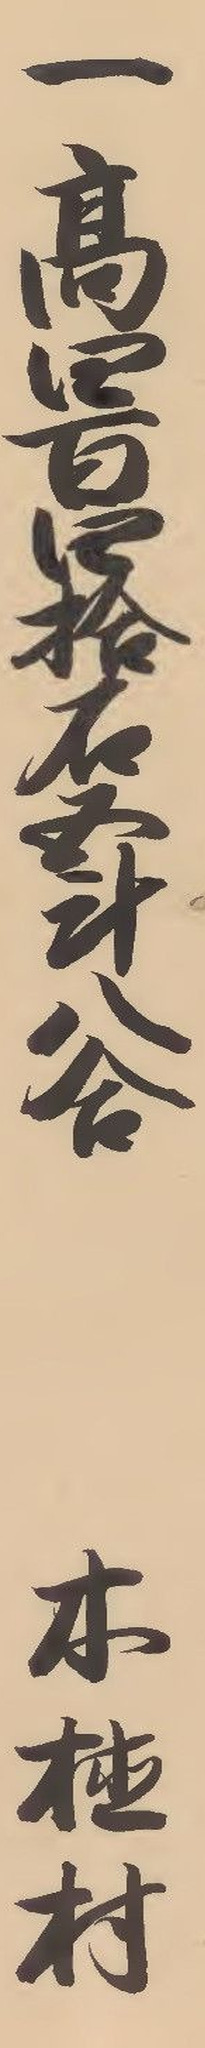一高四百四拾石五斗八合木植村
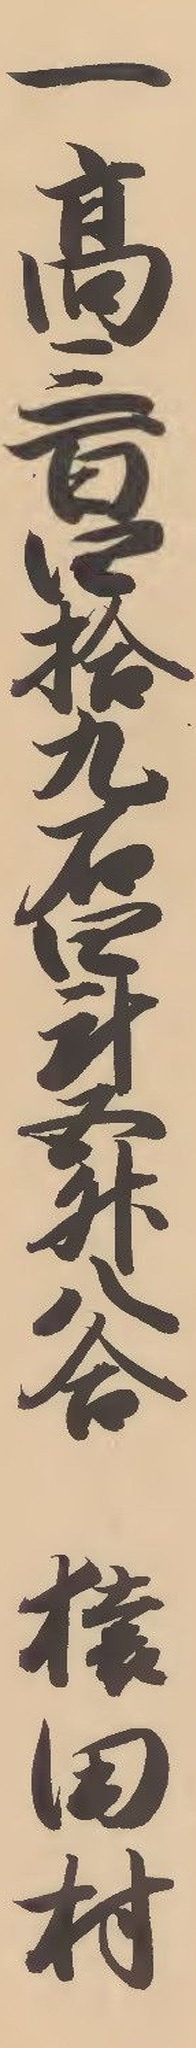一高三百四拾九石四斗五升八合猿田村

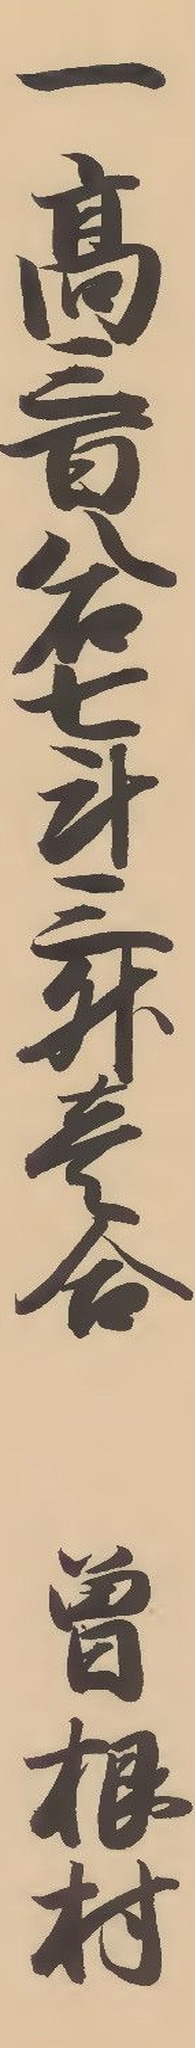一高三百八石七斗三升壱合曽根村
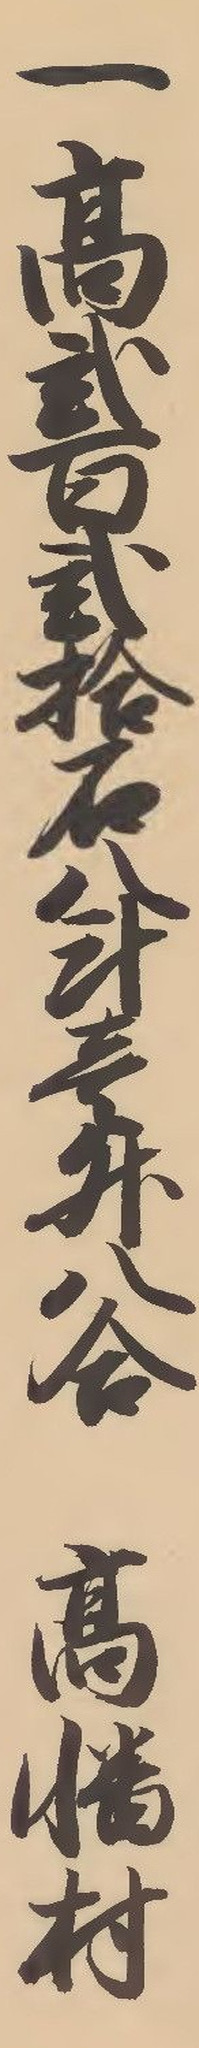一高弐百弐拾石八斗壱升八合高幡村
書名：常陸国郷帳
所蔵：国立公文書館 National Archives of Japan
